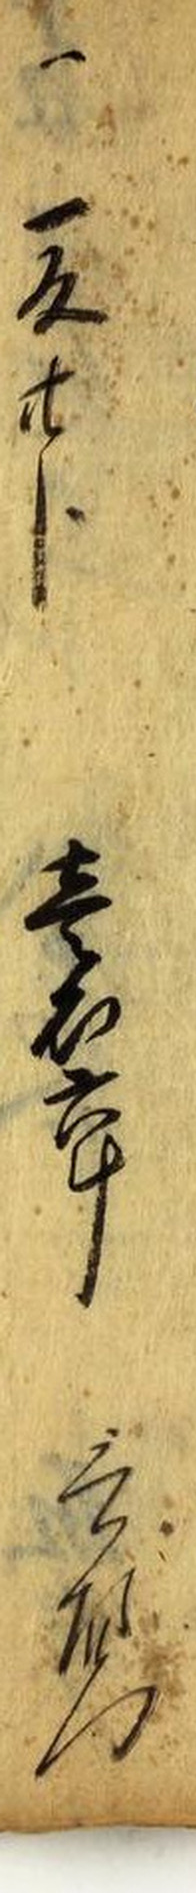同一反廿分壱石六斗三郎左衛門
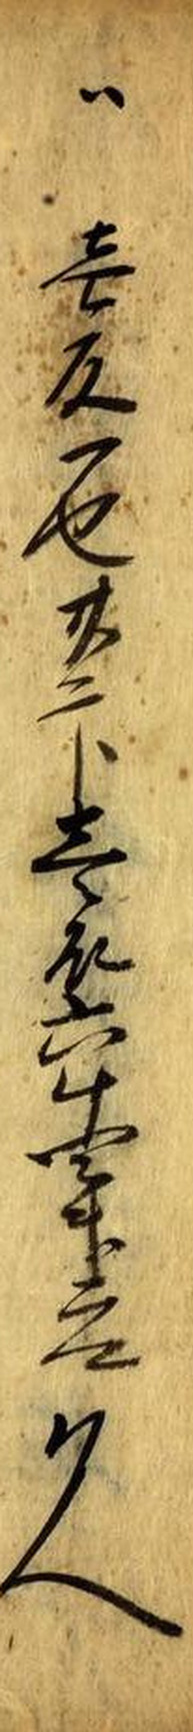同壱反一セ廿二分壱石六斗四升二合同人
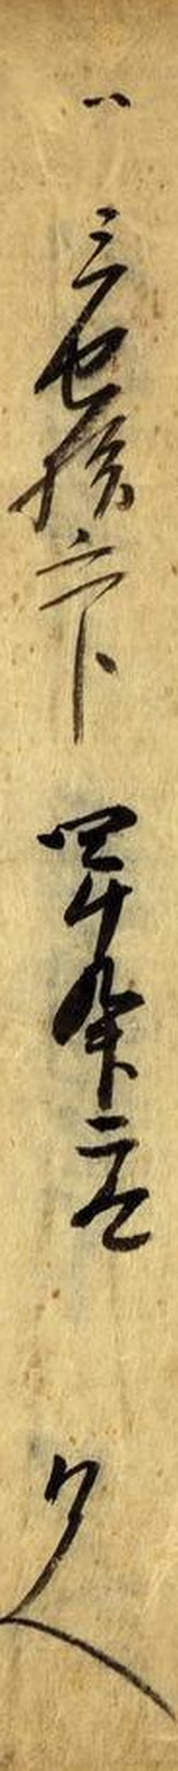同三セ拾六分四斗八升二合同人
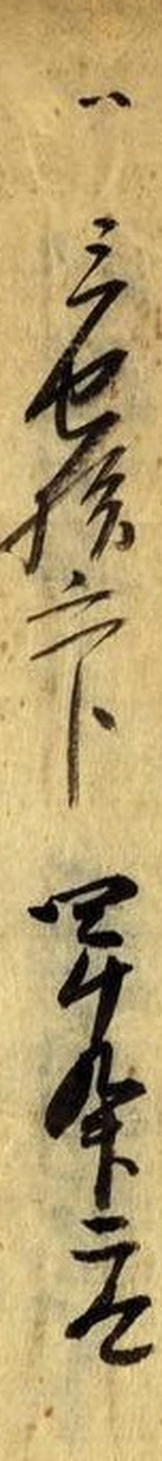同三セ拾六分四斗八升二合同人
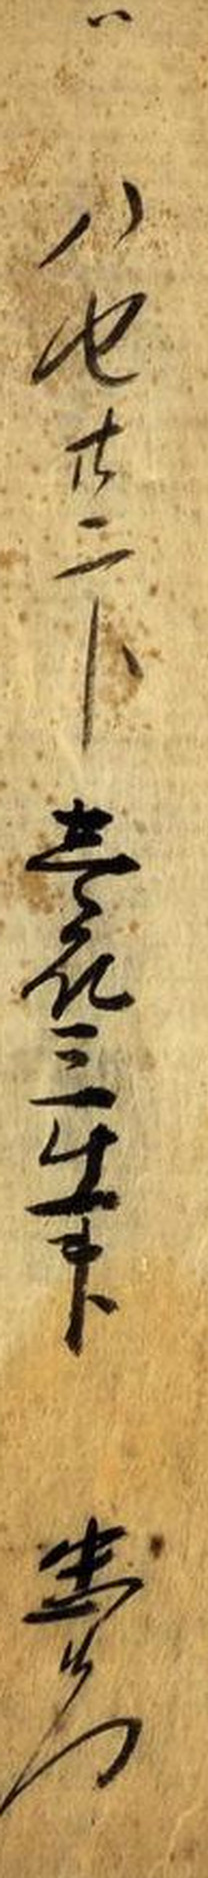同八セ廿弐分壱石三斗一升忠右衛門
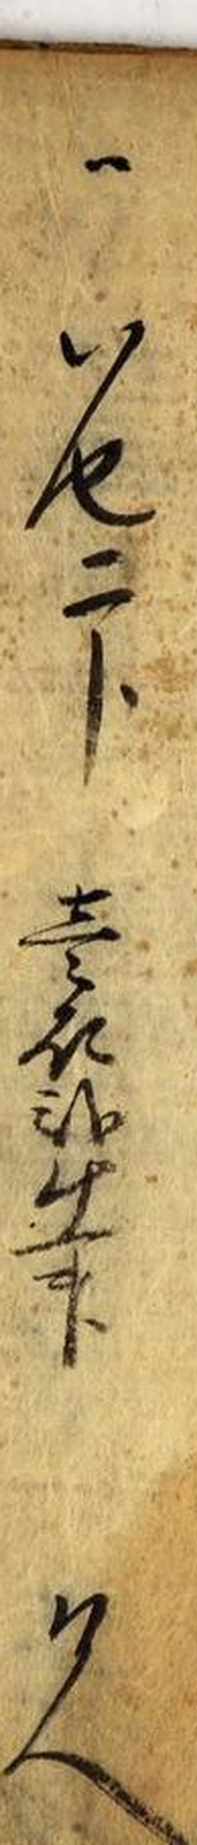同八セ二分壱石弐斗一升同人

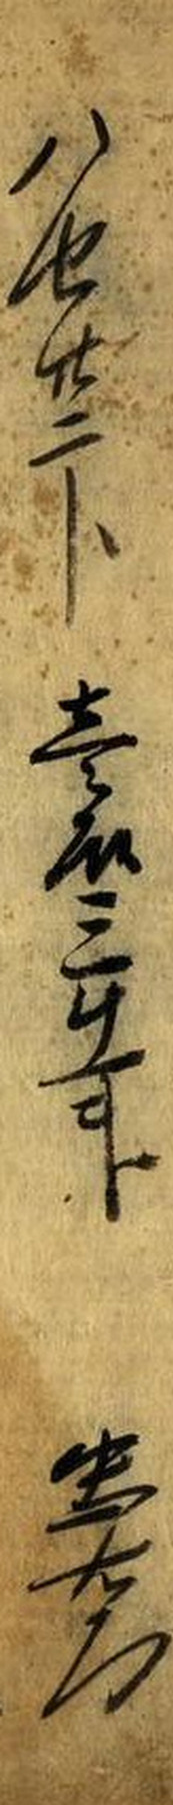同八セ廿二分壱石三斗一升忠右衛門
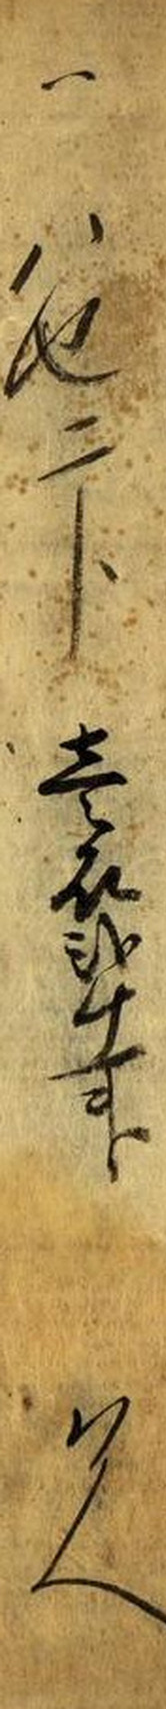同八セ二分壱石弐斗一升同人
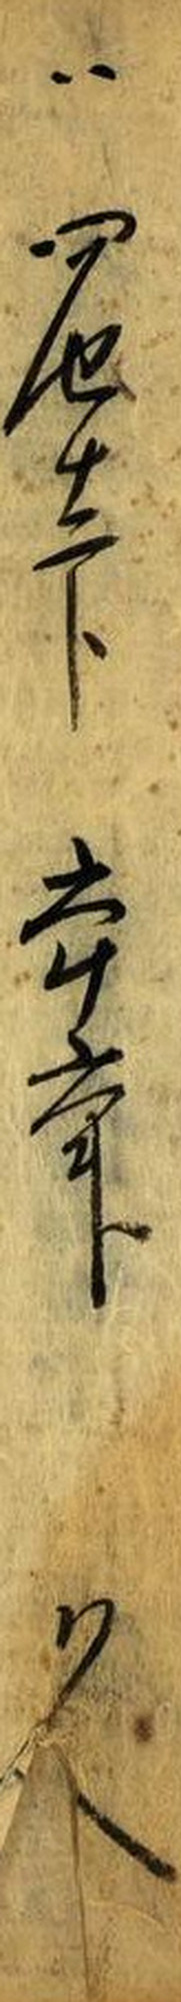同四セ十二分六斗六升同人
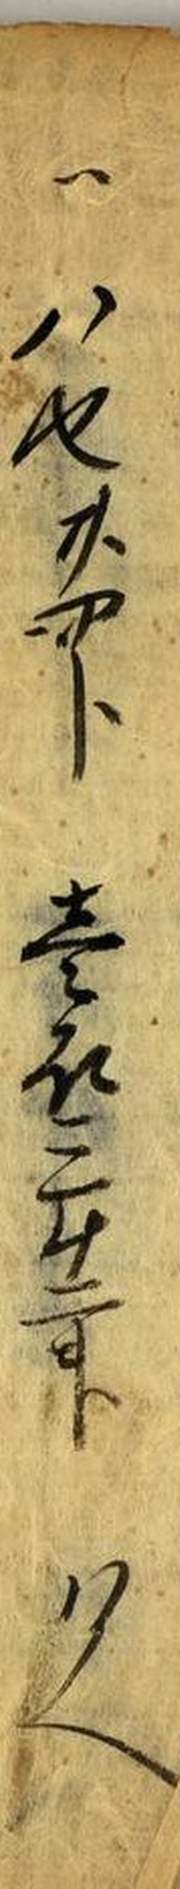同八セ廿四分壱石二斗二升同人
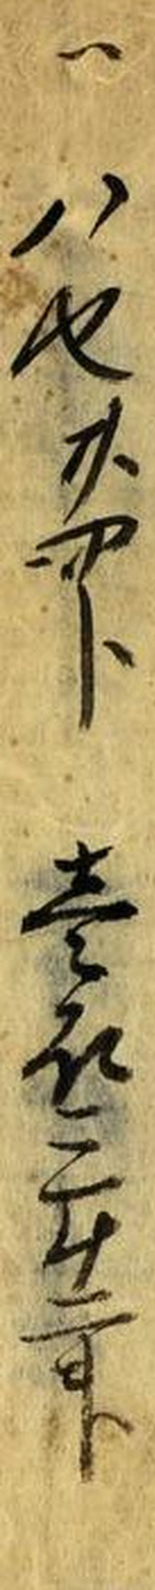同八セ廿四分壱石二斗二升同人
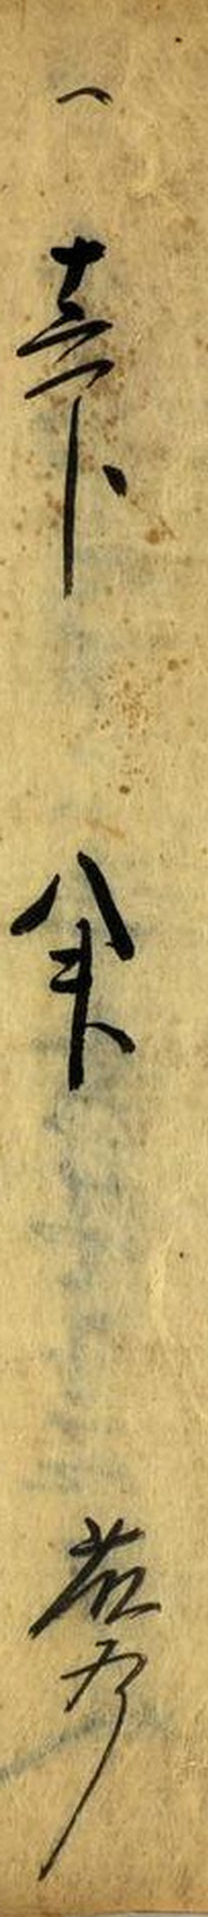同十三分八升藤九郎
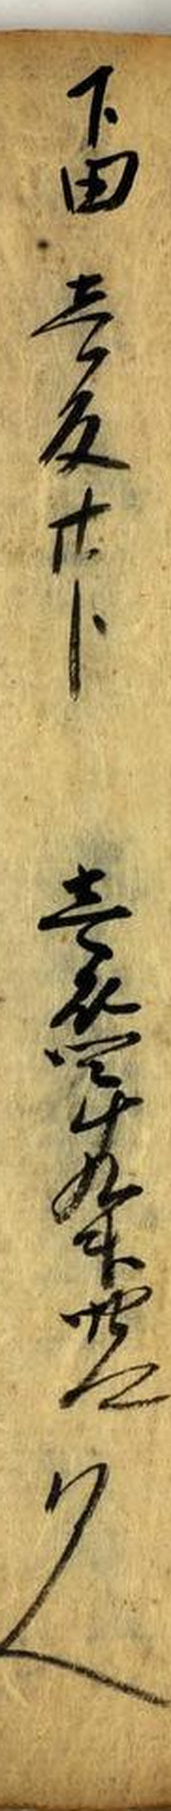下田壱反廿分壱石四斗九升四合同人
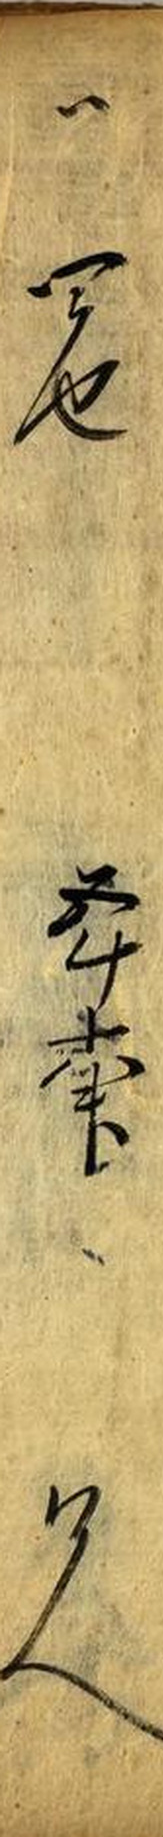同四セ五斗六升同人
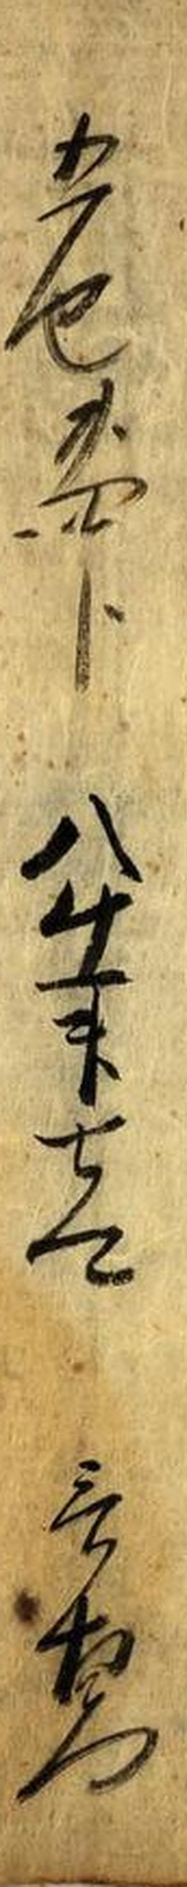同五セ廿四分八斗一升七合三郎左衛門
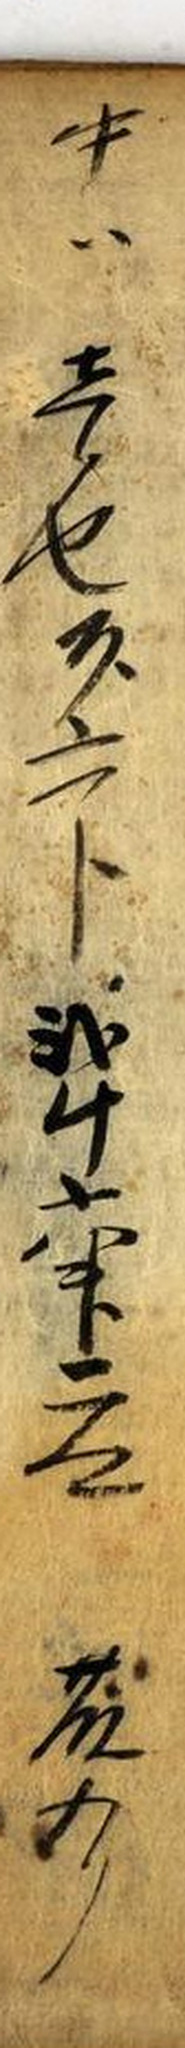中同壱セ廿六分弐斗六升二合藤九郎
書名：越前国西方内志津庄内本折村御検地帳
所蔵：福井県文書館 Fukui Prefectural Archives
